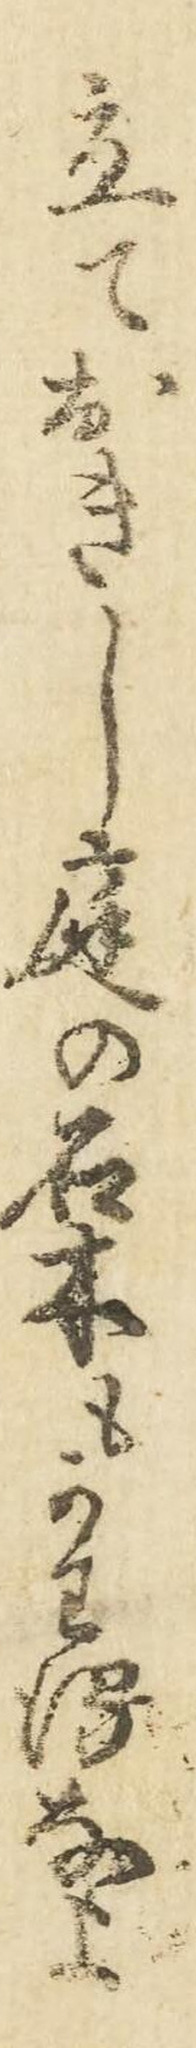立ておきし庭の石木もかわるなよ
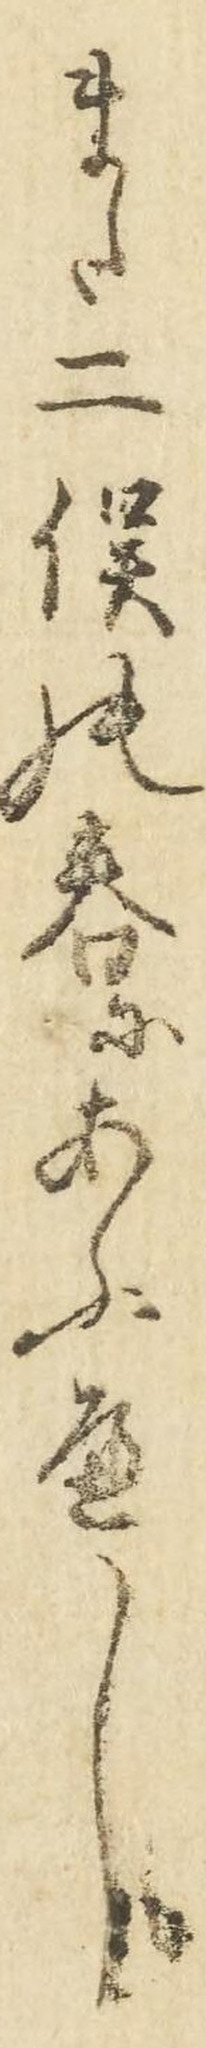また二俣の春にあふへし
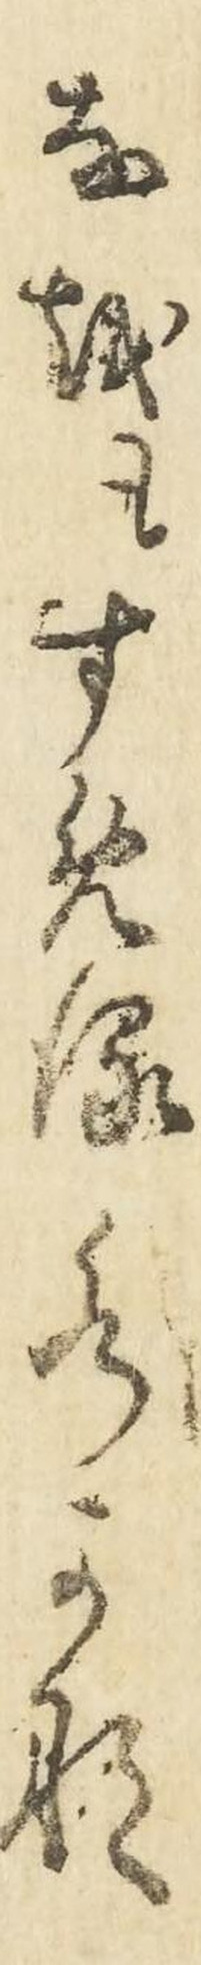なをもすめる水かな
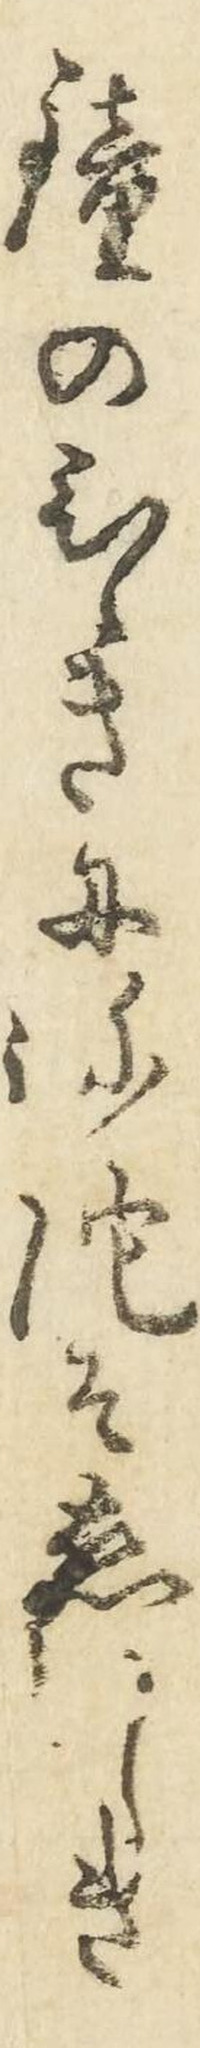鐘のひゝきに弥陀そ恋しき

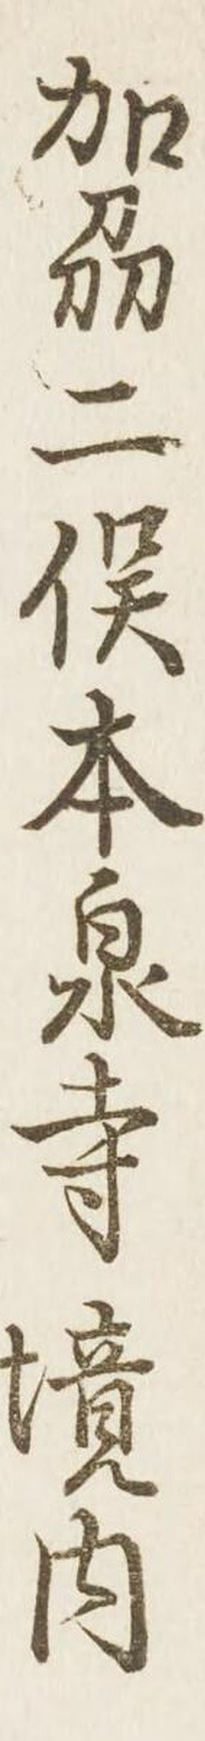加州二俣本泉寺境内
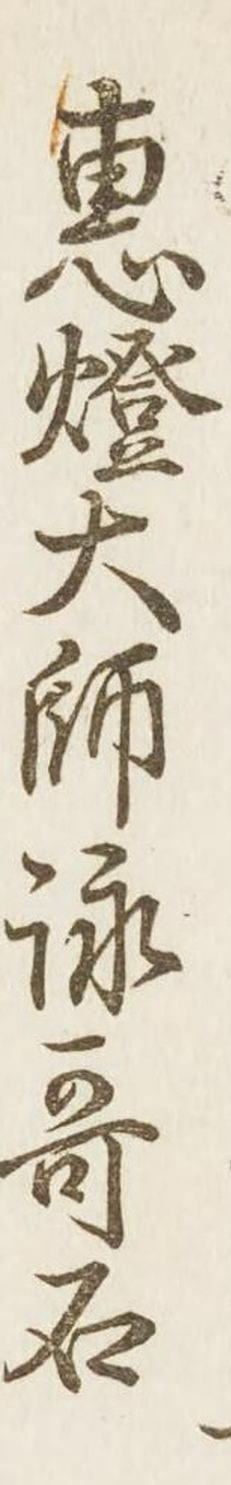恵燈大師詠歌石
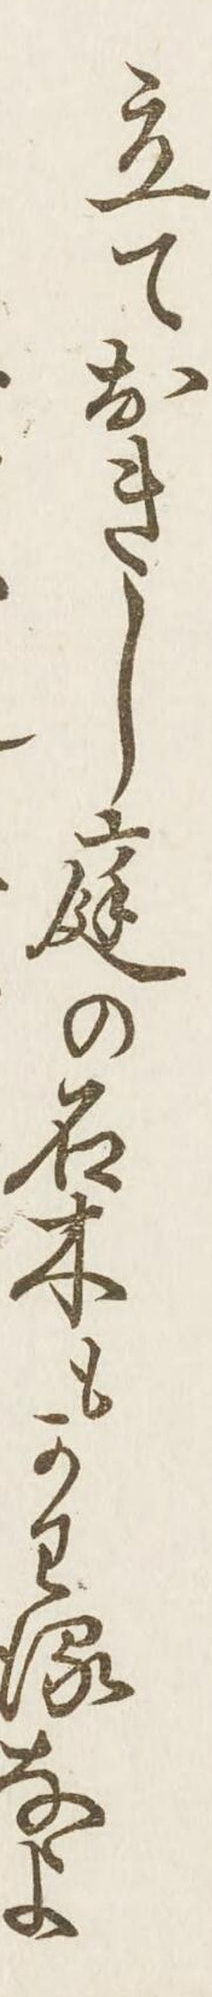立ておきし庭の石木もかわるなよ
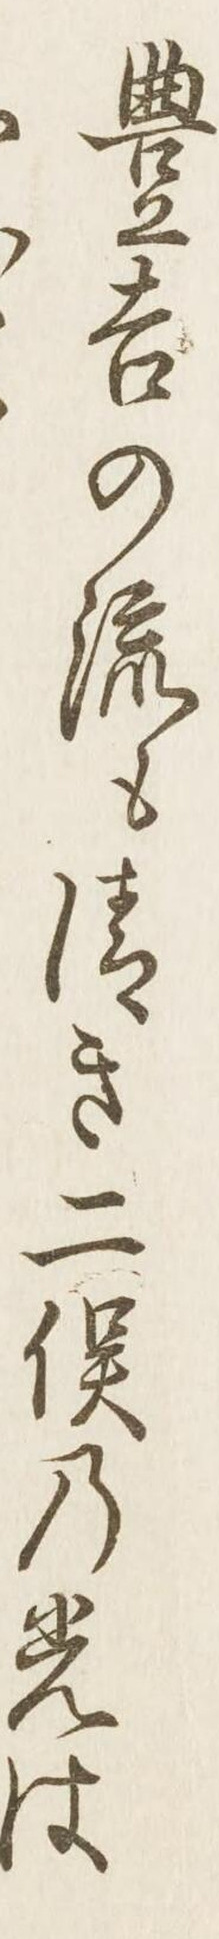豊吉の流も清き二俣の光は
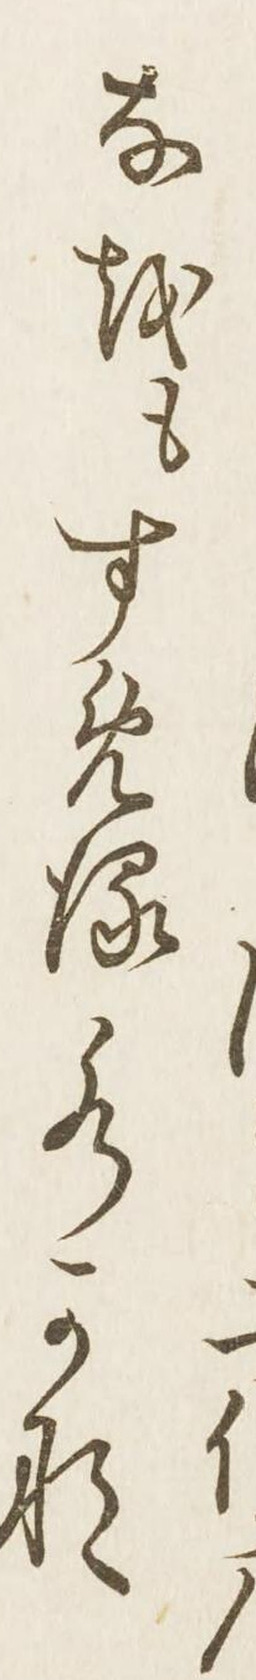なをもすめる水かな
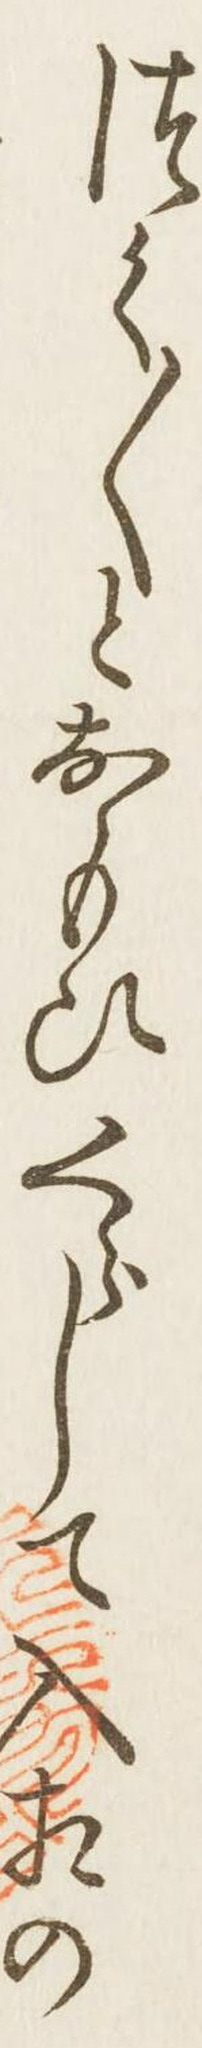つく〳〵とおもひくらして入相の
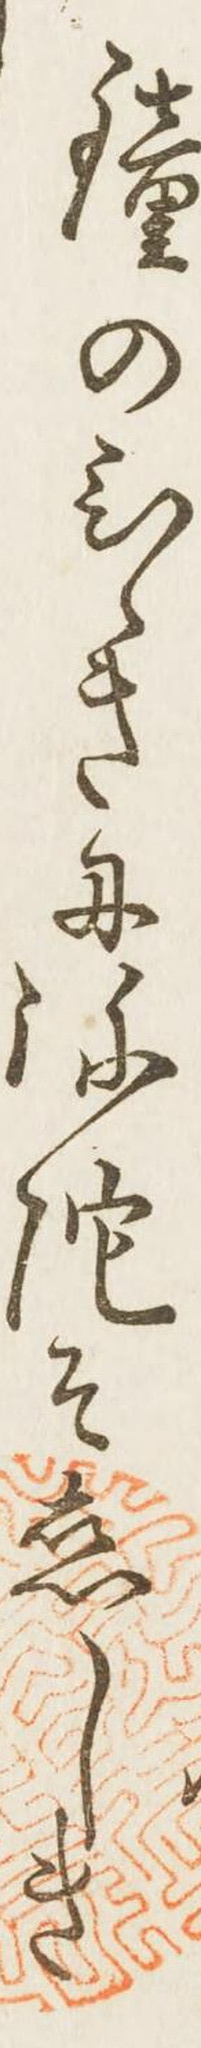鐘のひゝきに弥陀そ恋しき

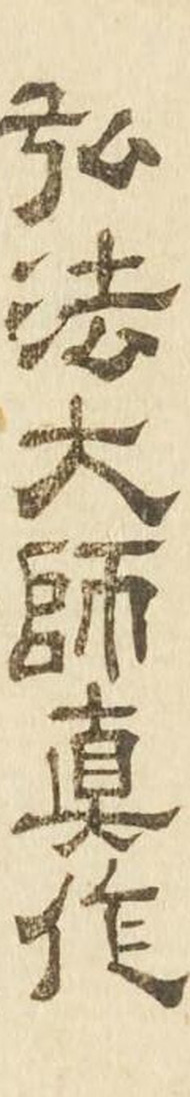弘法大師真作
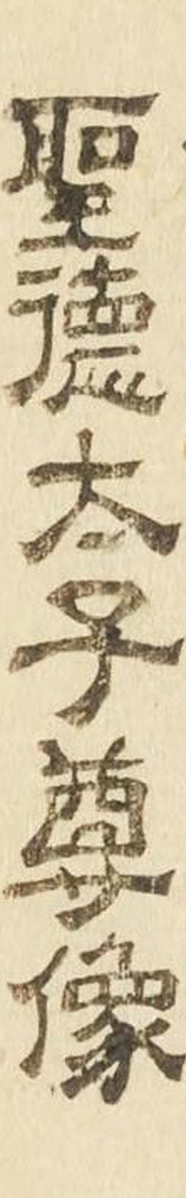聖徳太子尊像

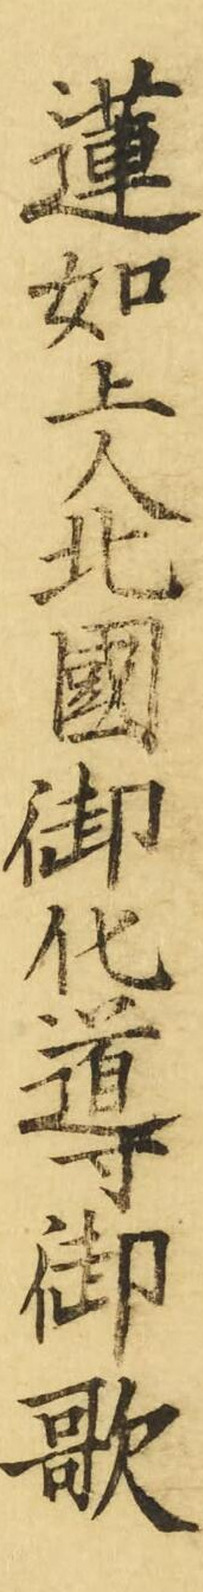蓮如上人北国御化導御歌
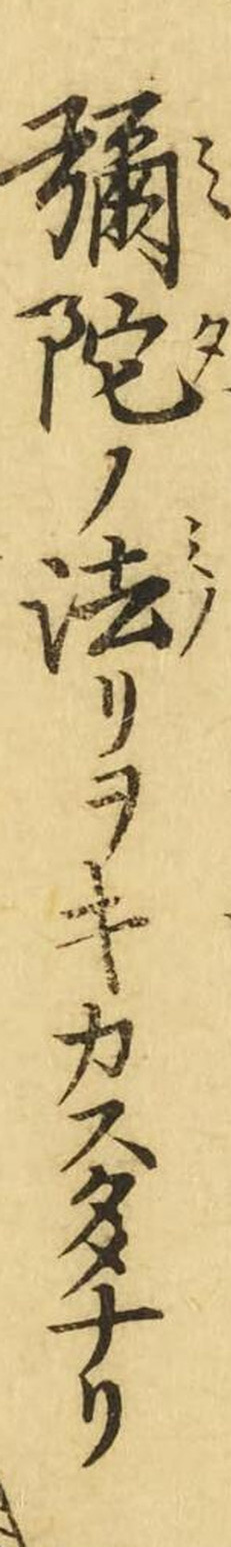弥陀ノ法リヲキカスタメナリ
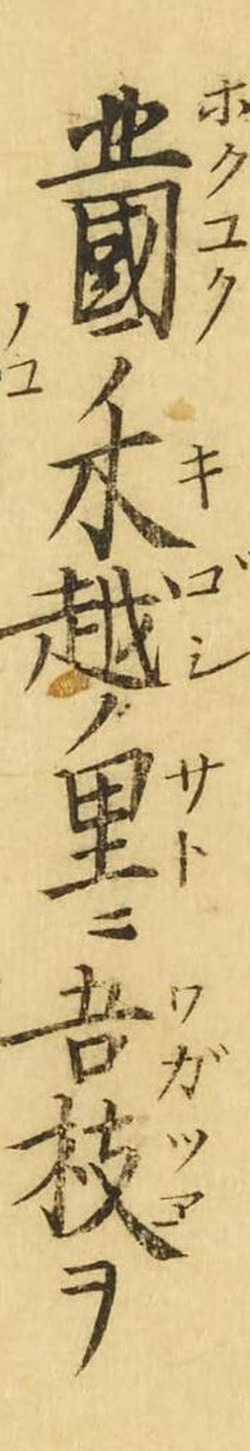北国ノ木越ノ里ニ吾杖ヲ
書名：加能真宗聖集
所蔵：Ishikawa Prefectural Library
